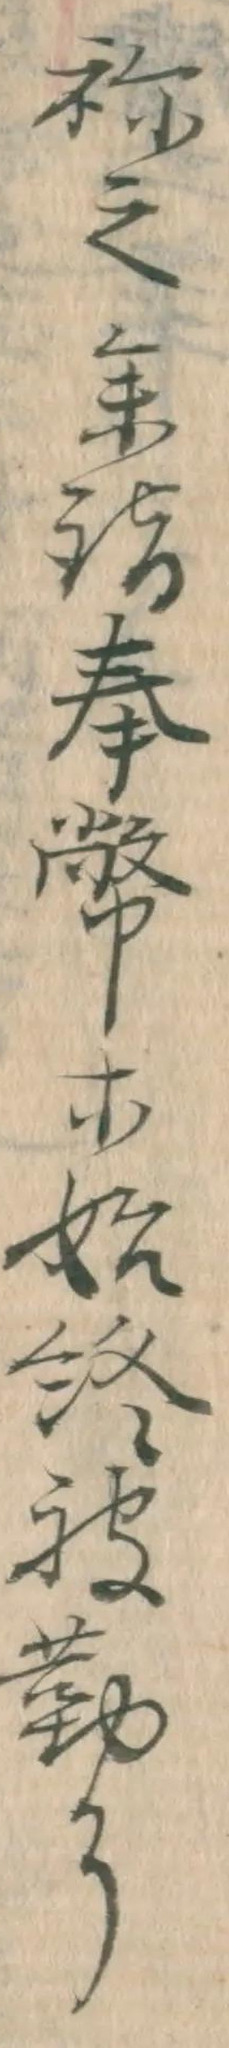祢之参詣奉幣等始終被勤了
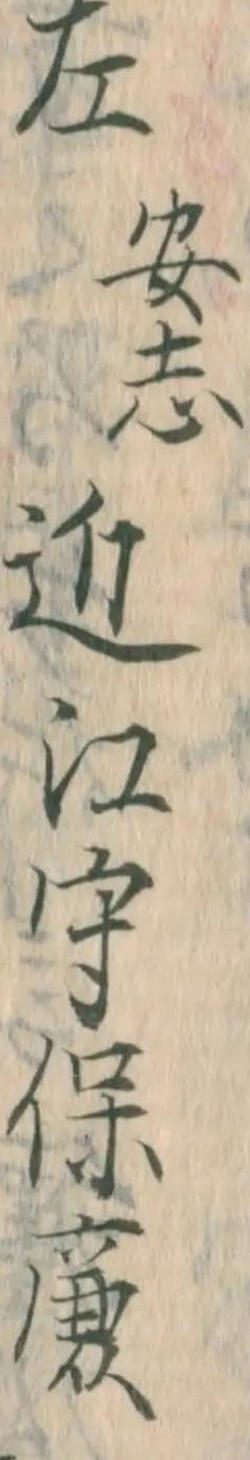左安志近江守保廉

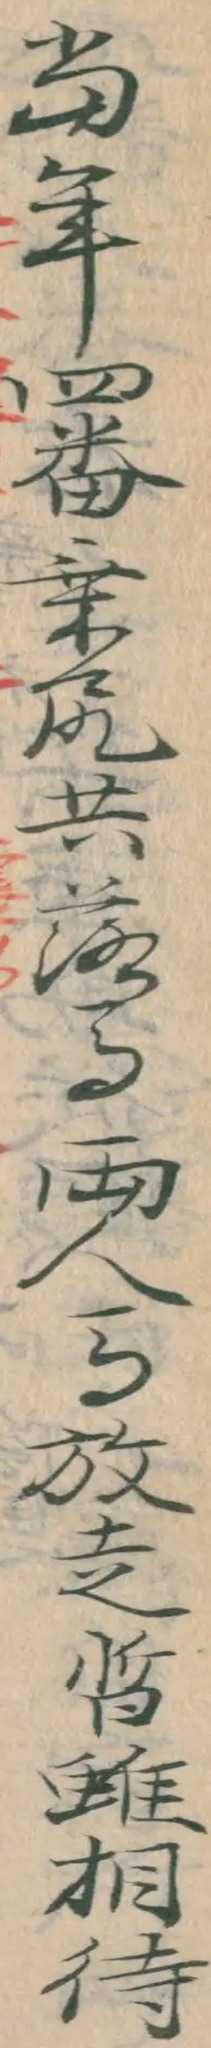当年四番乗尻共落馬両人馬放走暫雖相待
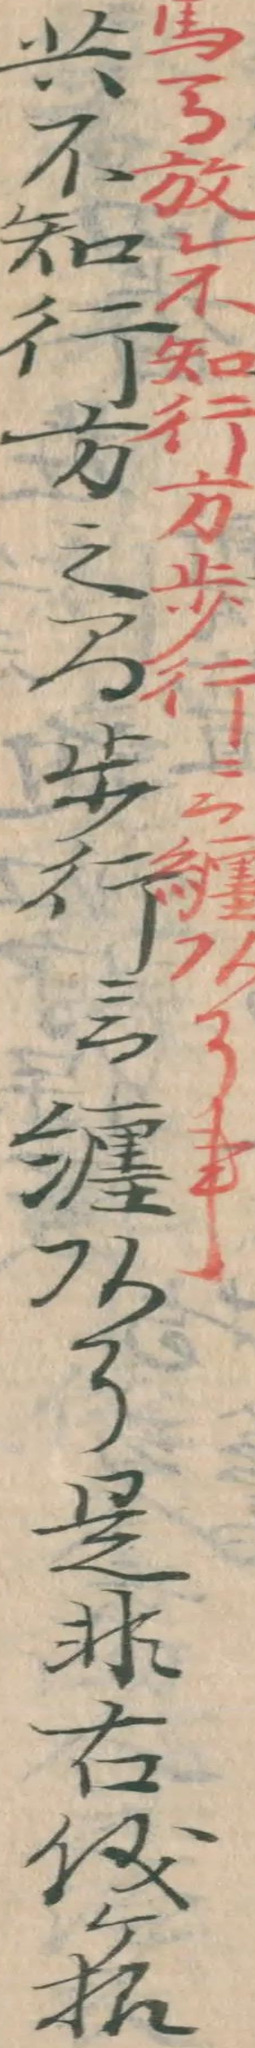共不知行方之間歩行ニ而纏頭了是非古儀ヶ様
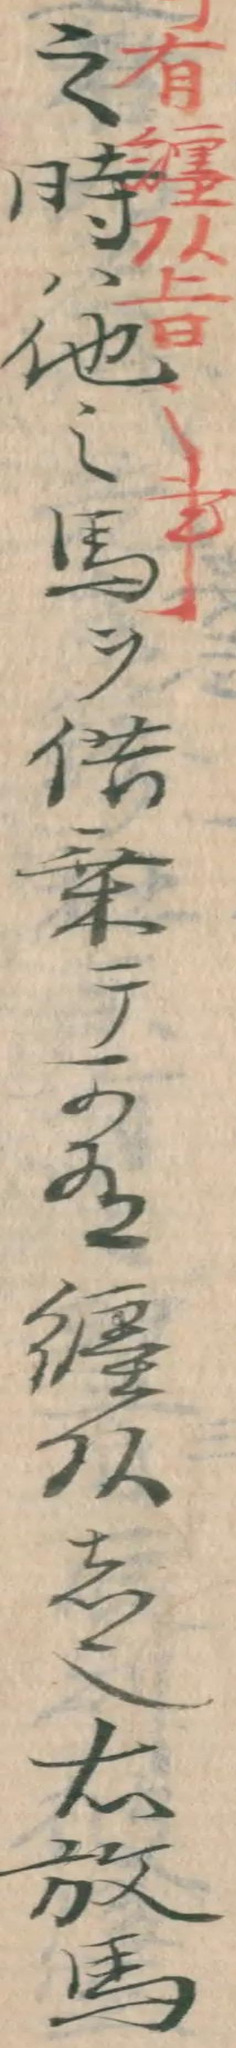之時ハ他之馬ヲ借乗テ可有纏頭者也右放馬
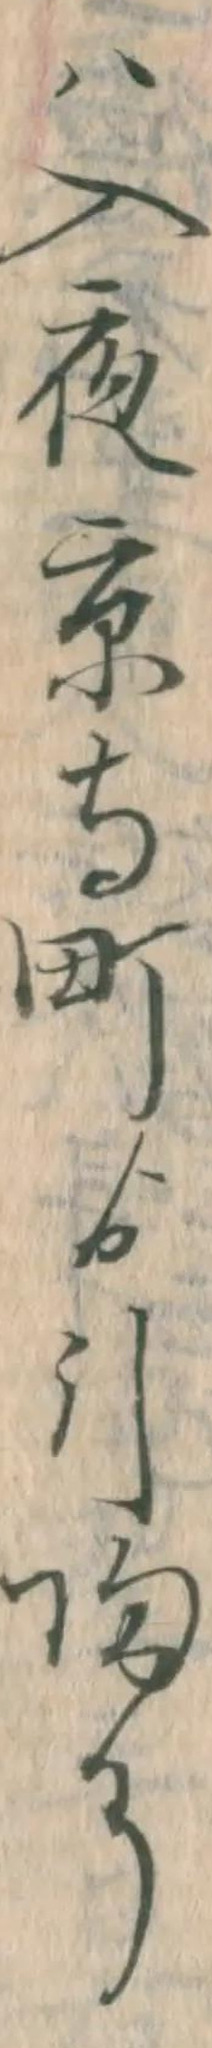ハ入夜京寺町ゟ引帰了
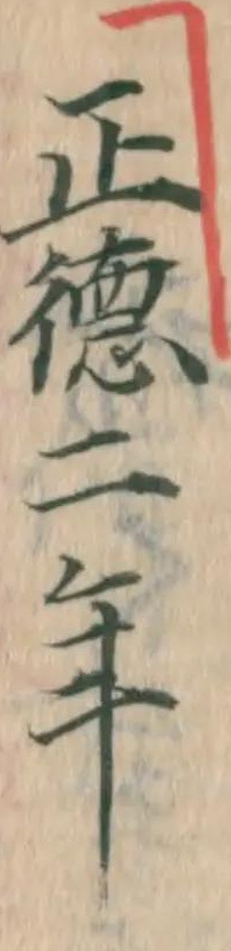正徳二年
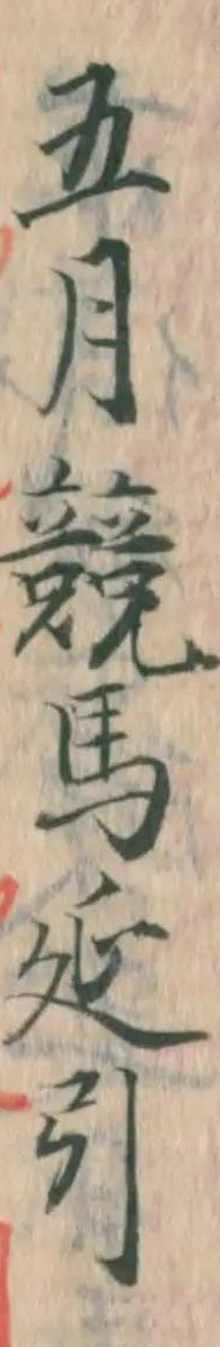五月競馬延引
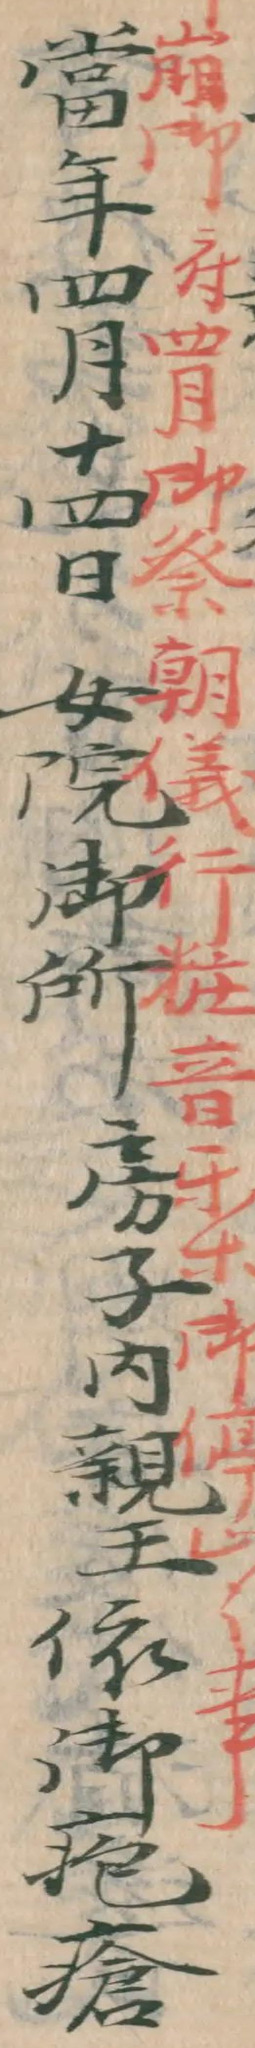当年四月十四日女院御所房子内親王依御疱瘡
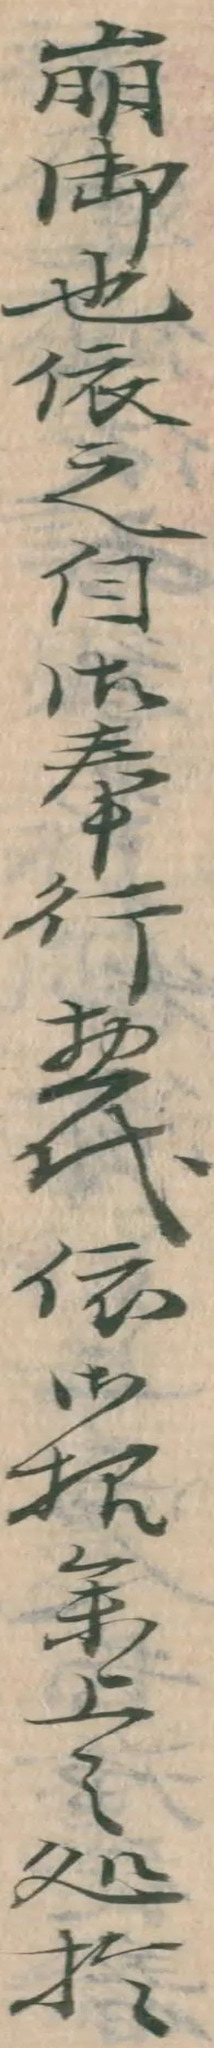崩御也依之自御奉行惣代依御様参上之処於
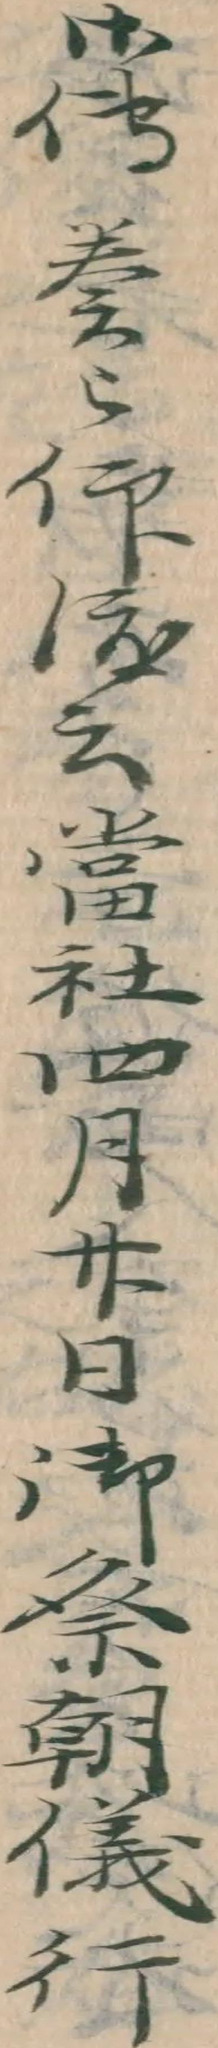御伝奏被仰渡云当社四月廿日御祭朝儀行
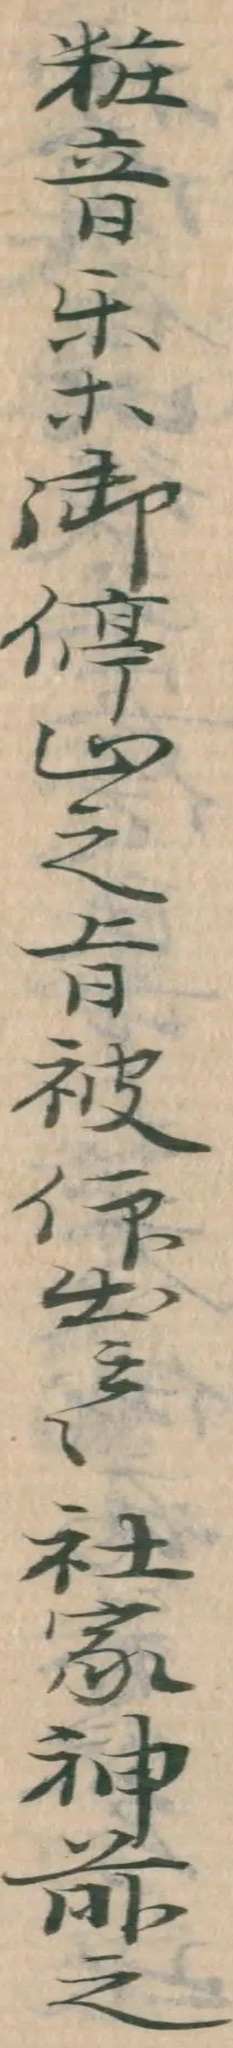粧音楽等御停止之旨被仰出云々社家神前之
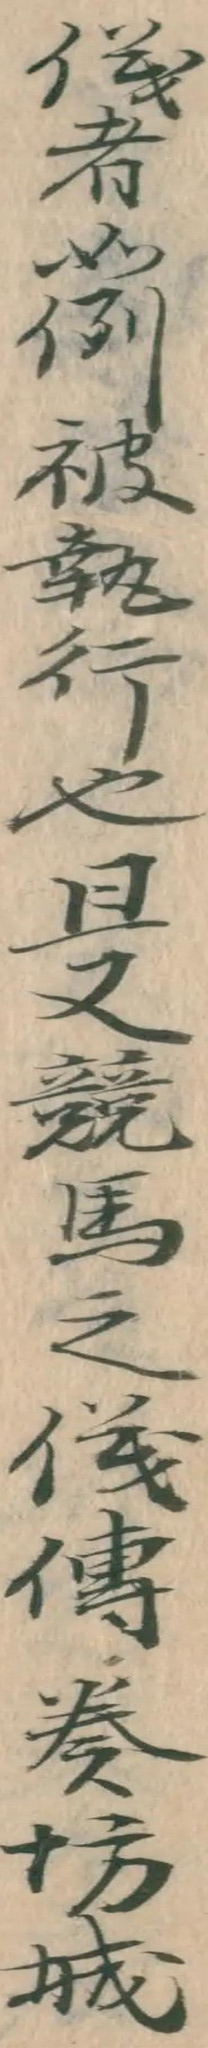儀者如例被執行也且又競馬之儀伝奏坊城
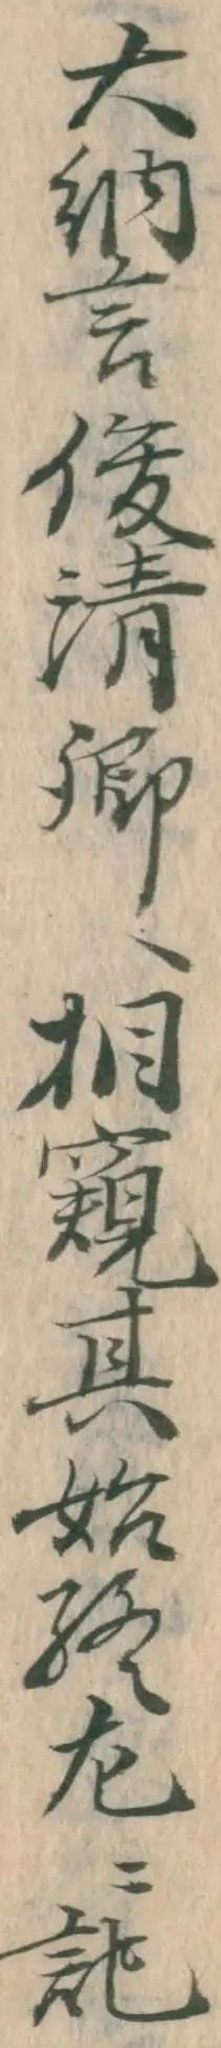大納言俊清卿へ相窺其始終左ニ記
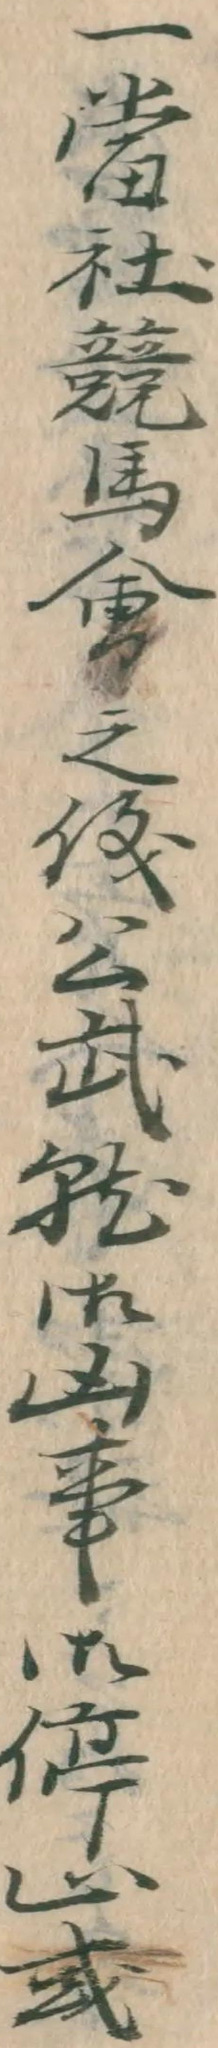一当社競馬会之儀公武就御凶事御停止或
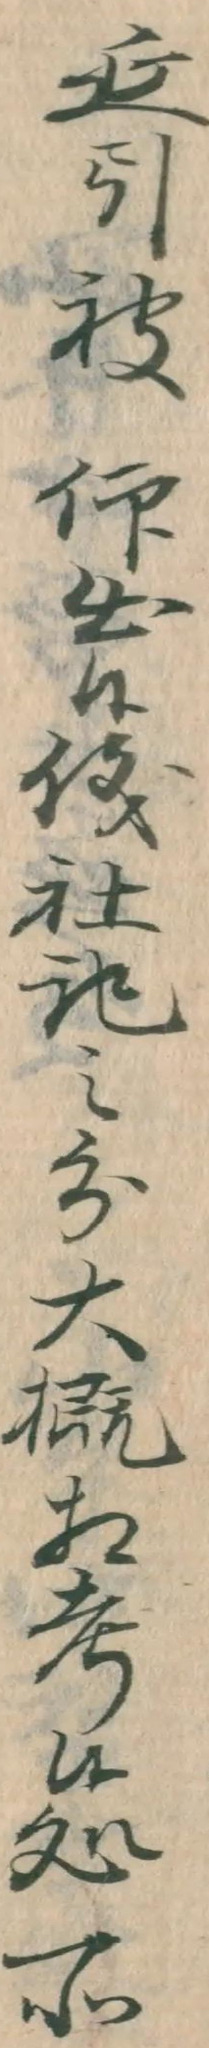延引被仰出候儀社記之分大概相考候処所
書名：賀茂社記録. 第10冊
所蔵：国立国会図書館 National Diet Library, JAPAN
